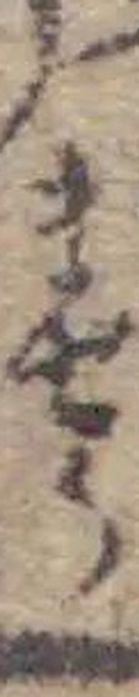ませう

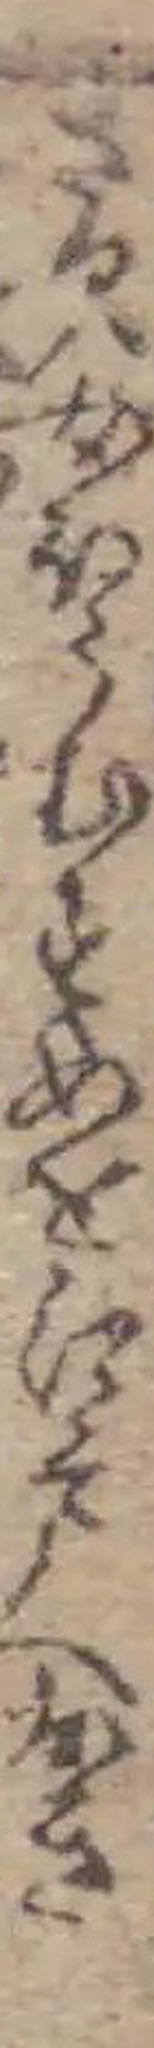さるは女ほうむすめを江戸へおき
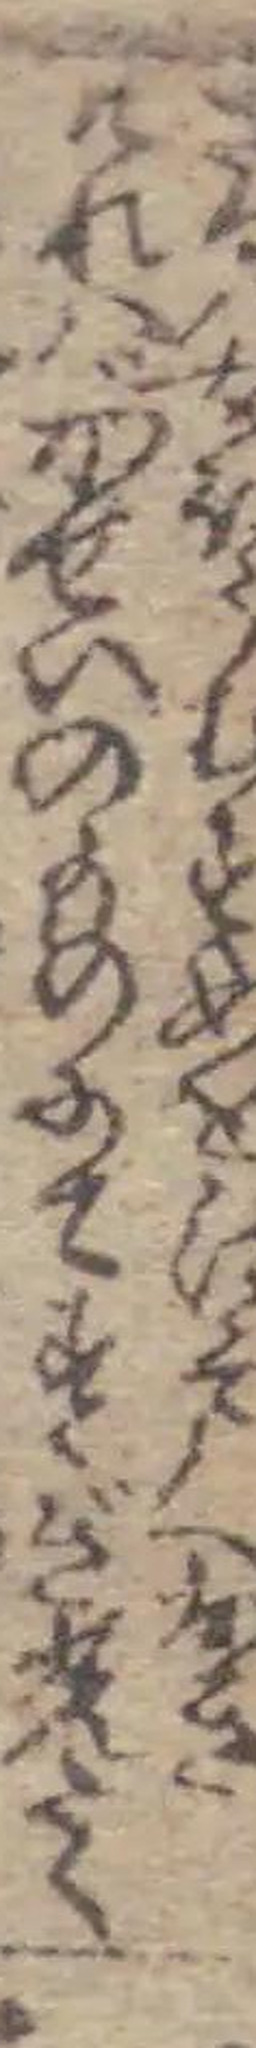けれはかせいのものにてすゝぎ先たく
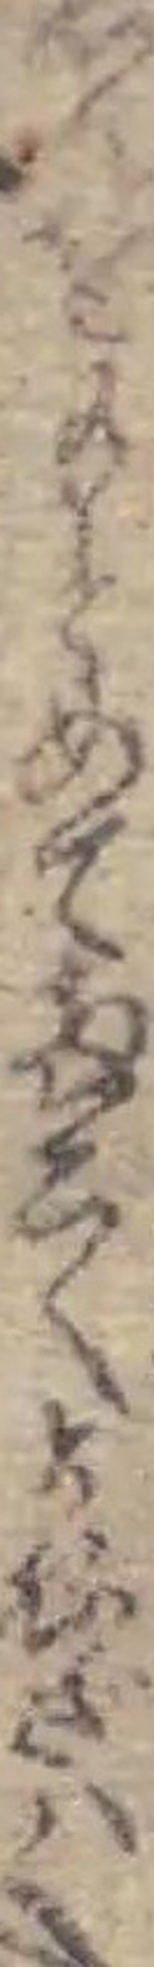ゑんをもとめて両こくよねざは
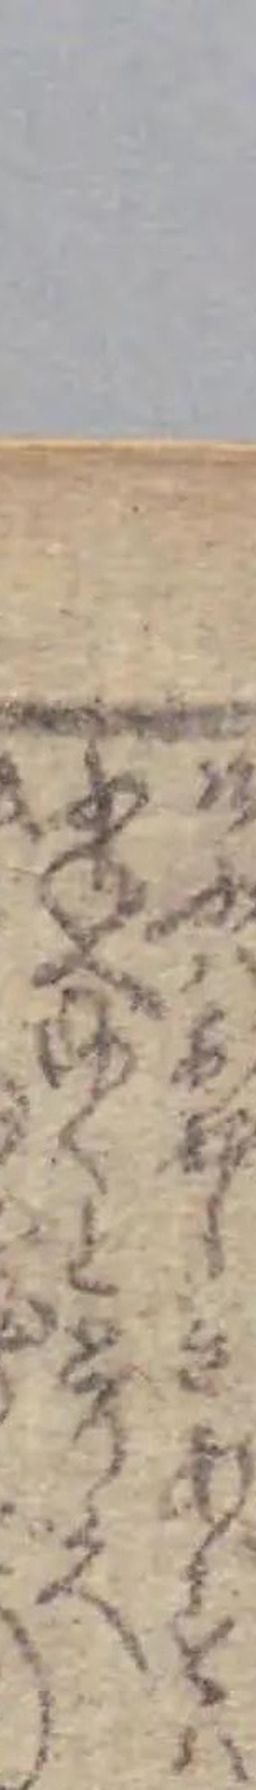ふねへゆくととりかへ
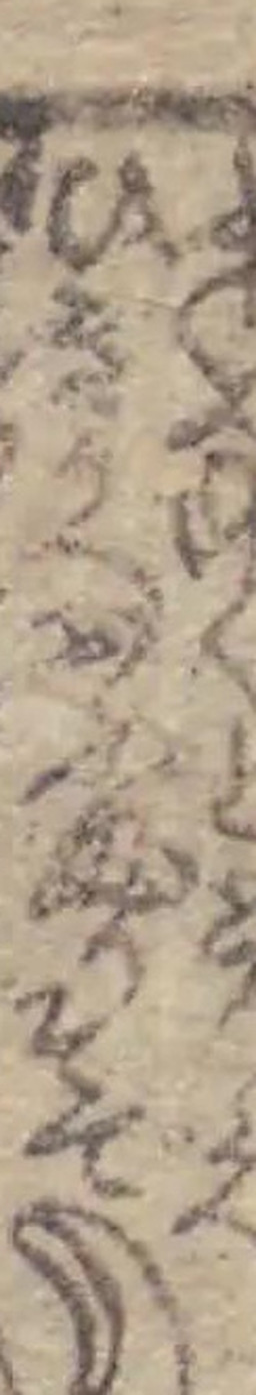ひきかへおふふりそで
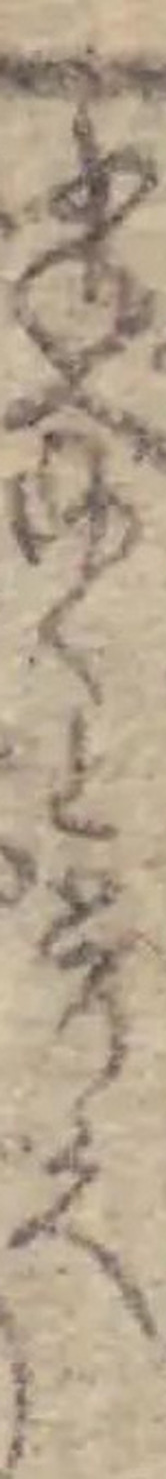ふねへゆくととりかへ
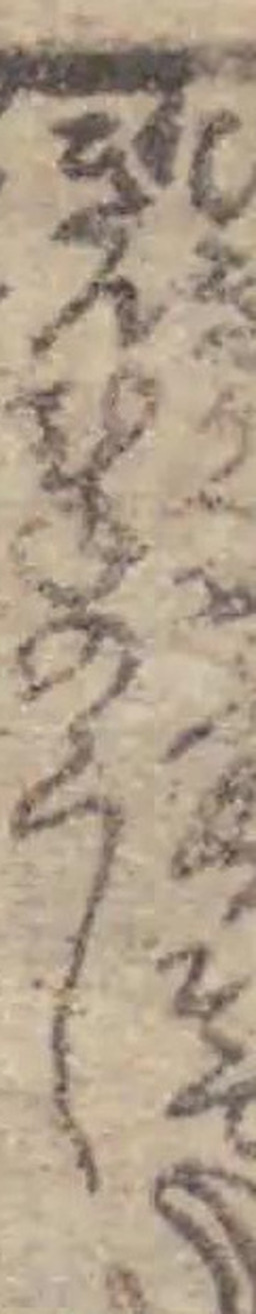ぎんむねのくし
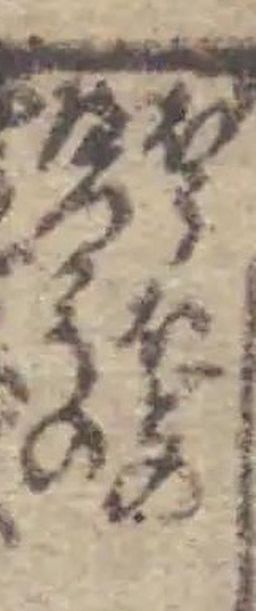へつかうの
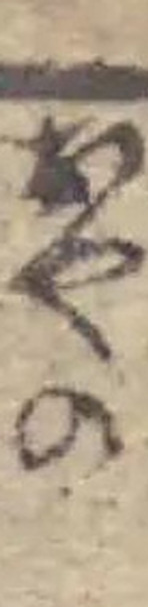おやの
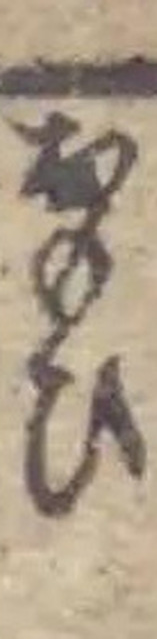おもひ
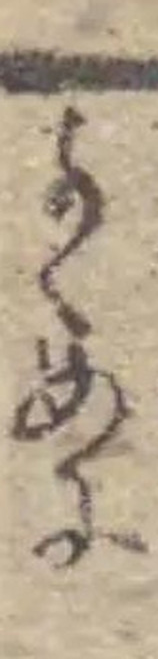よくめに
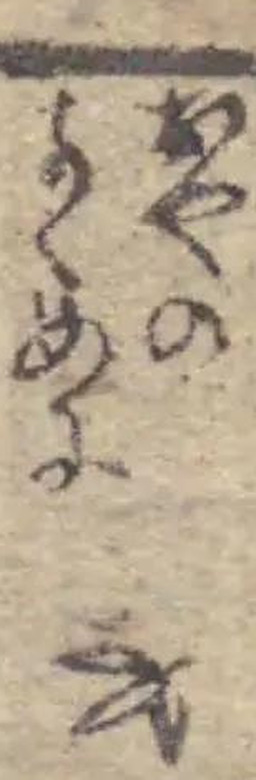よくめに
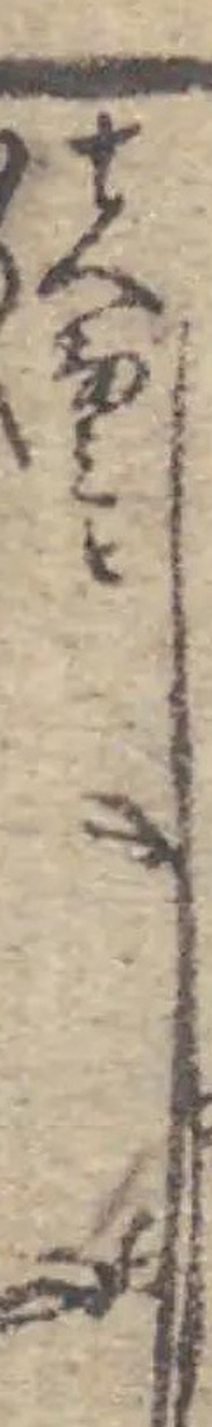十人なみと
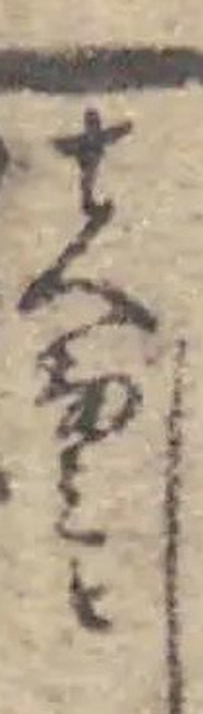十人なみと
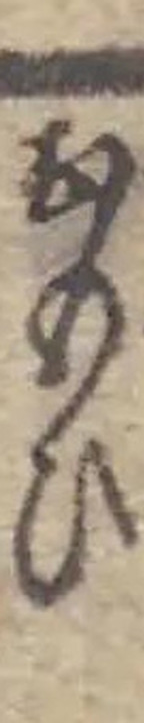おもひ
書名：蟹牛房挟多 3巻
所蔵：国立国会図書館 National Diet Library, JAPAN
